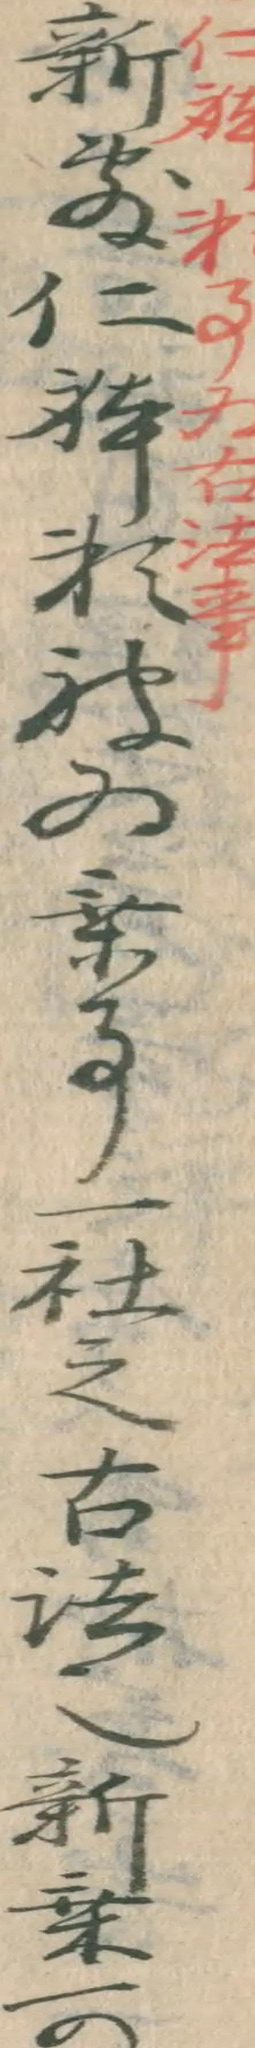新敷仁体頼被為乗事一社之古法也新乗可
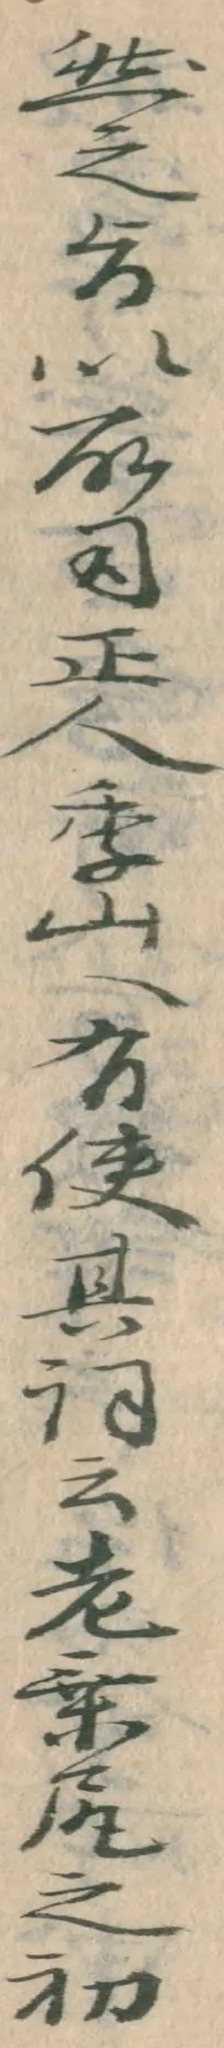然之旨以所司正人季山へ有使其詞云老乗尻之初
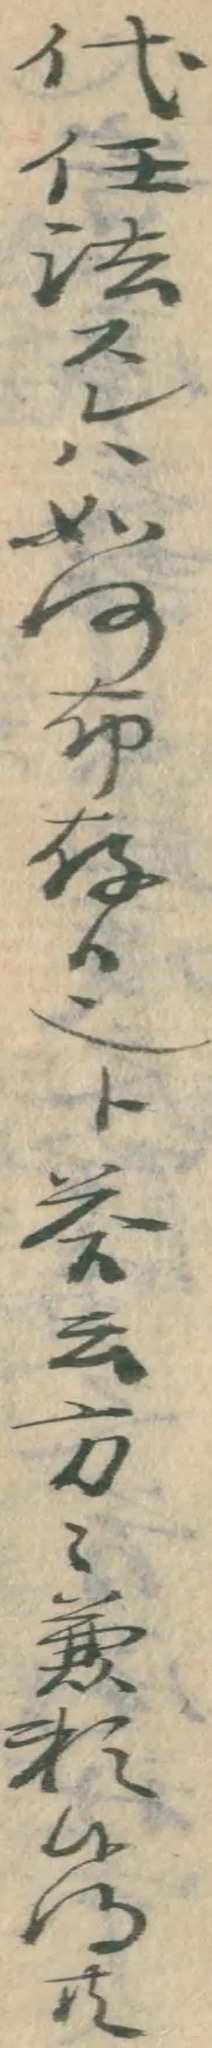代任法スレハ如何布存候也ト答云方々兼頼候得共
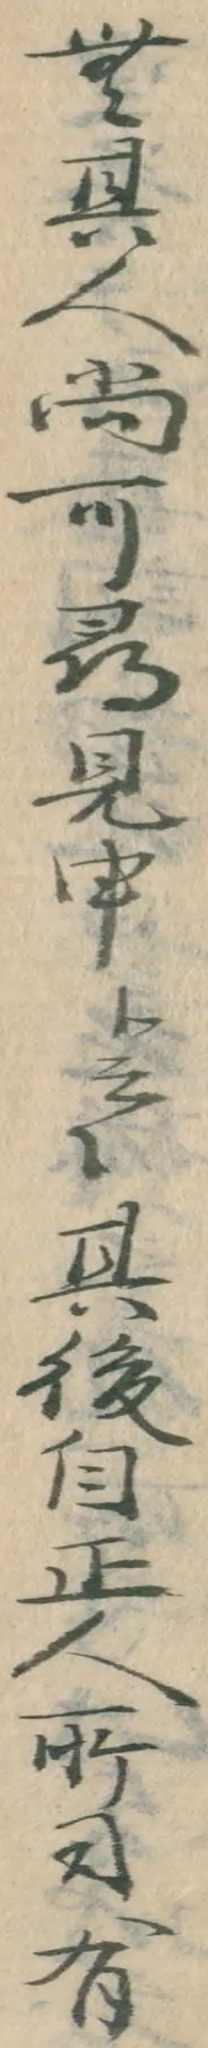無其人尚可尋見申ト云々其後自正人所司へ有

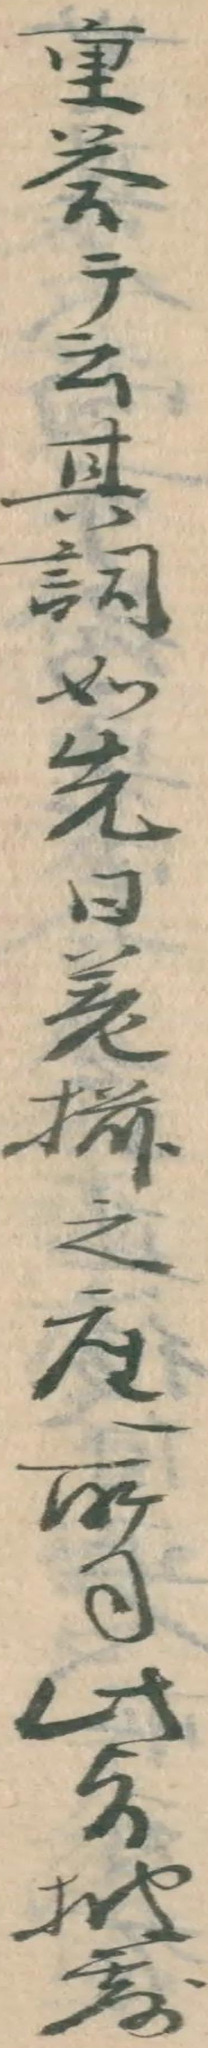重答テ云其詞如先日差揃之座へ所司此旨披露
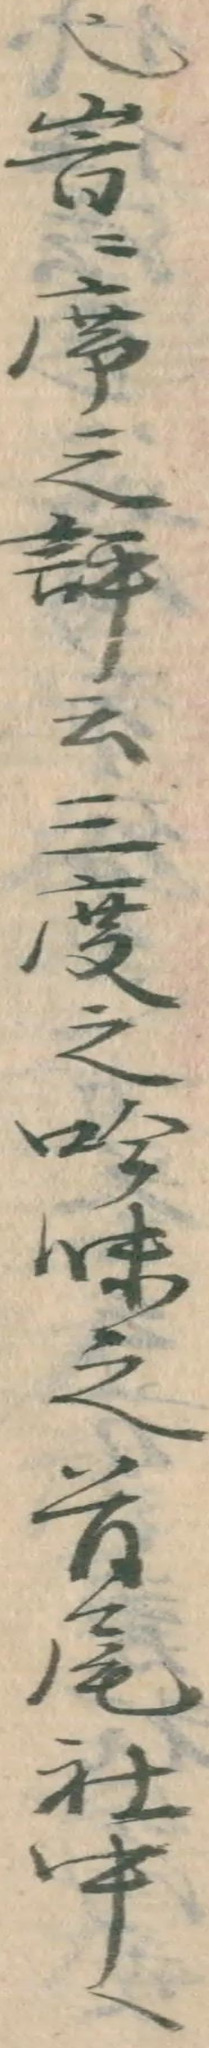也旹ニ席之評云三度之吟味之首尾社中ヘ
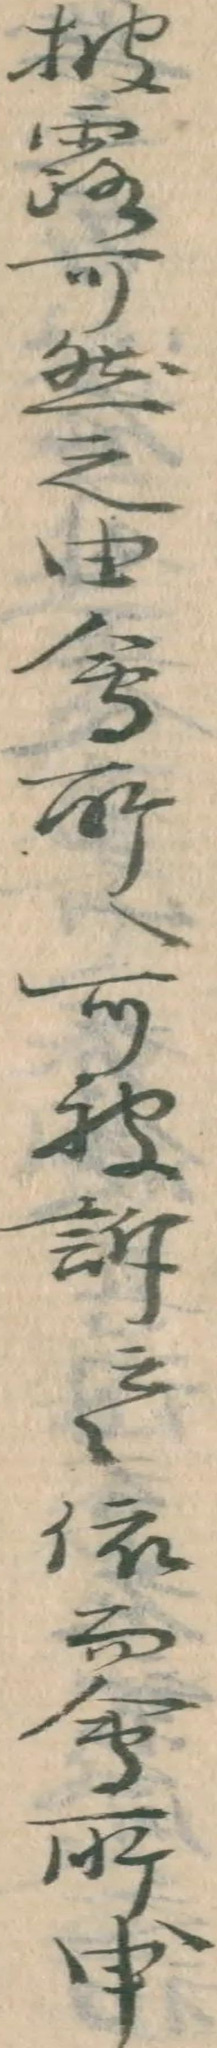披露可然之由会所へ可被訴云々依而会所ヘ申
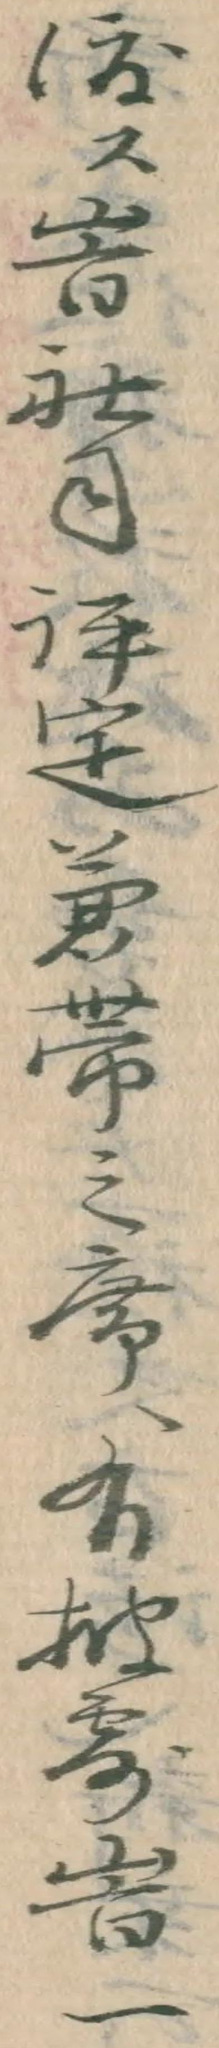渡ス旹社司評定兼帯之席へ有披露旹一
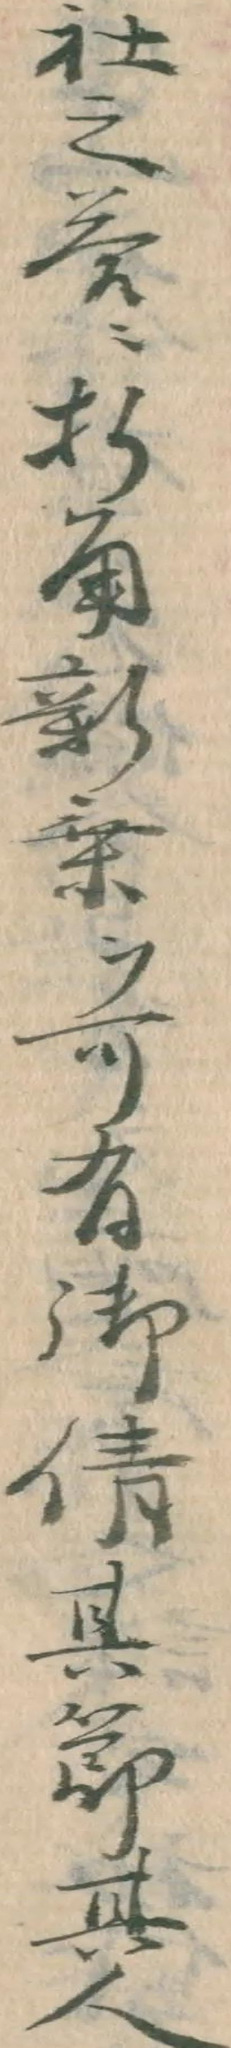社之答ニ折角新乗ヲ可有御請其節其人
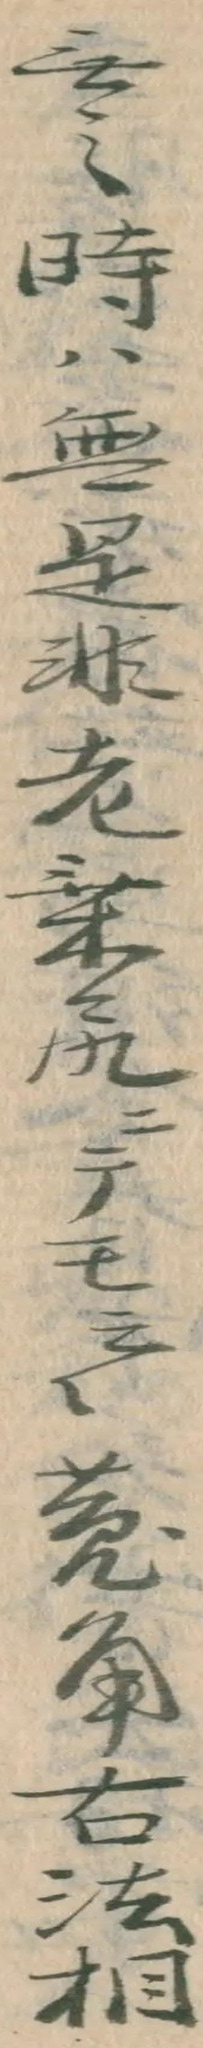無之時ハ無是非老乗尻ニテモ云々兎角古法相
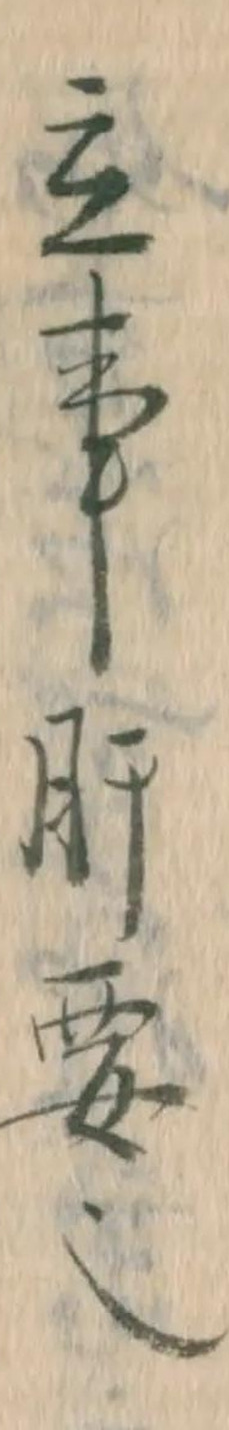立事肝要也
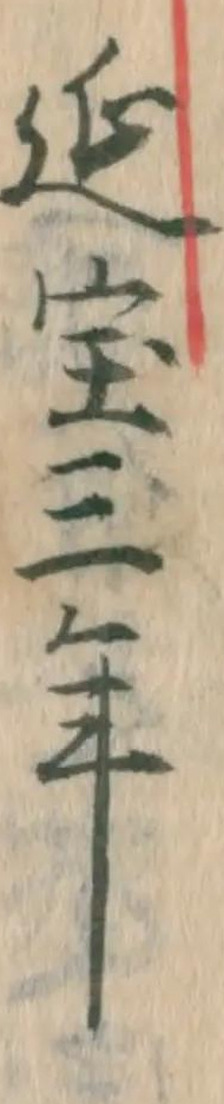延宝三年
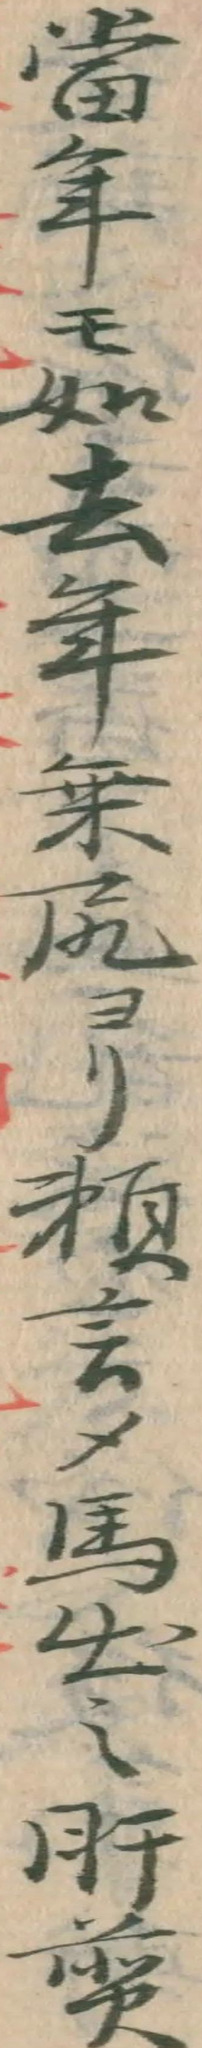当年モ如去年乗尻ヨリ頼言シテ馬出之肝煎
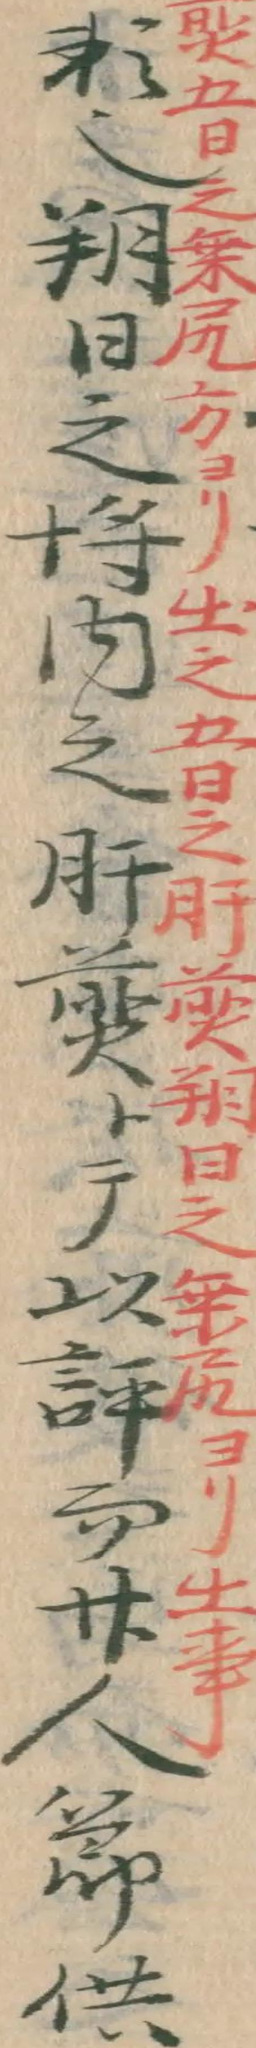頼也朔日之埒内之肝煎トテ以評而廿人節供
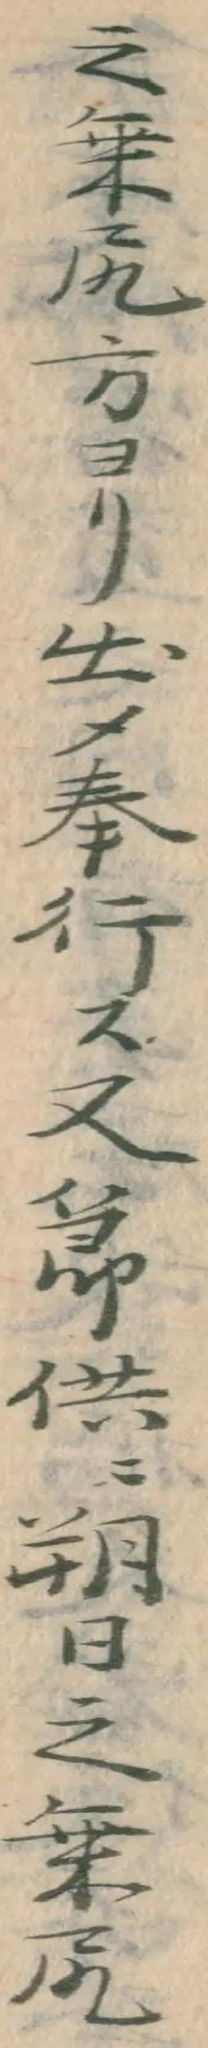之乗尻方ヨリ出シテ奉行ス又節供ニ朔日之乗尻
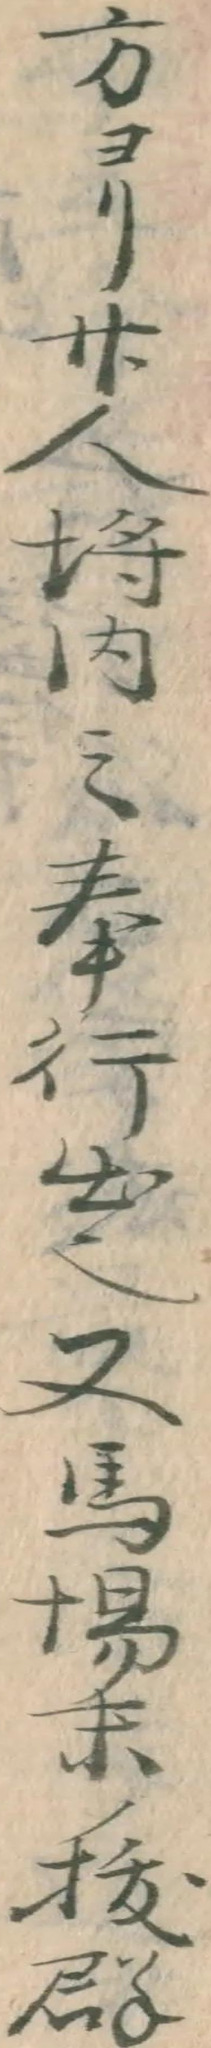方ヨリ廿人埒内之奉行出也又馬場末ノ抜群
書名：賀茂社記録. 第10冊
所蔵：国立国会図書館 National Diet Library, JAPAN
